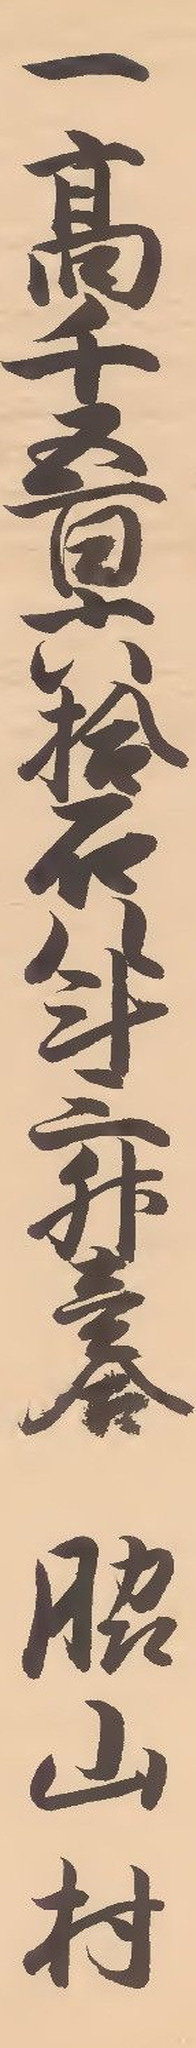一高千五百六拾石八斗三升壱合脇山村
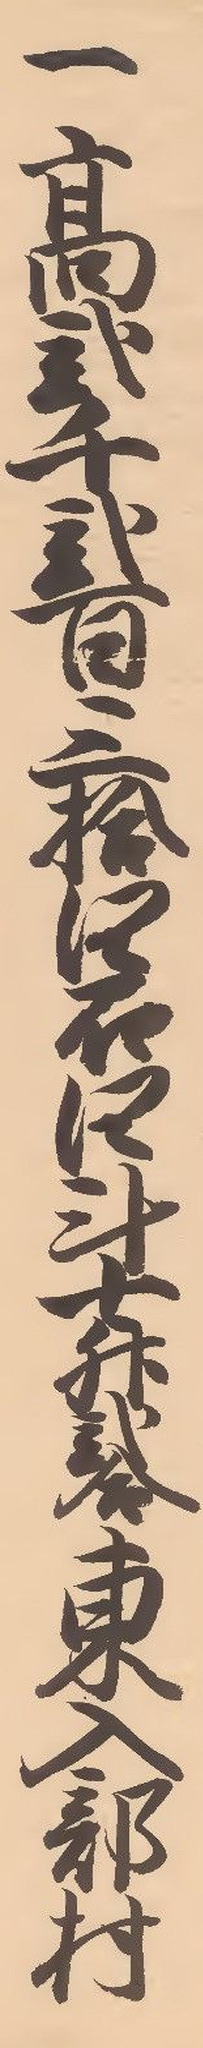一高弐千弐百三拾四石四斗七升弐合東入部村
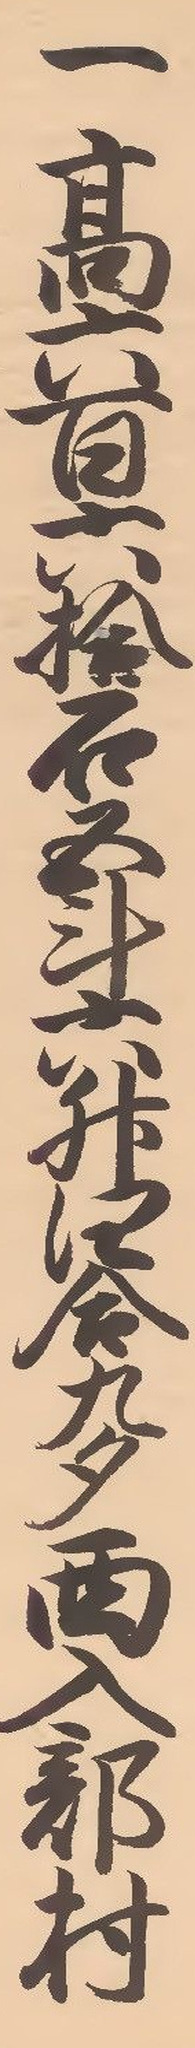一高六百六拾石五斗六升四合九勺西入部村
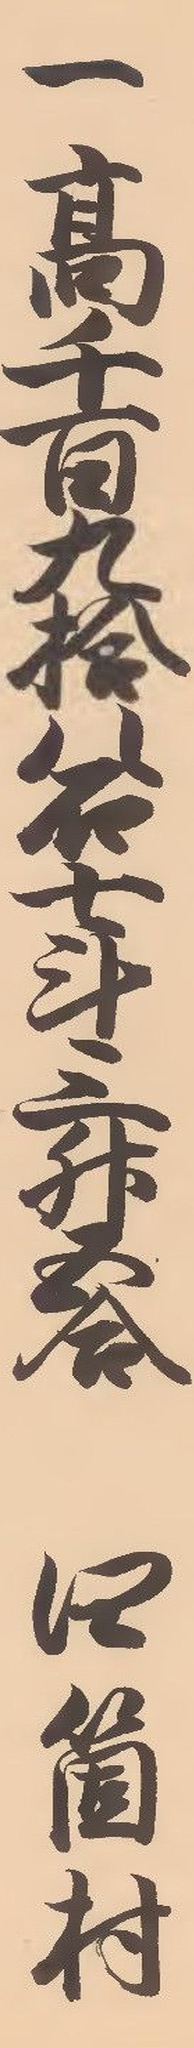一高千百九拾八石七斗三升五合四箇村
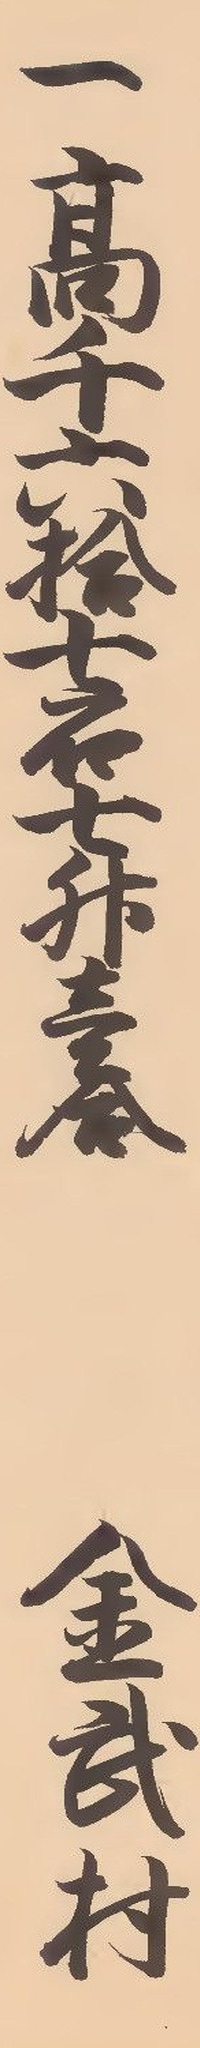一高千六拾七石七升壱合金武村
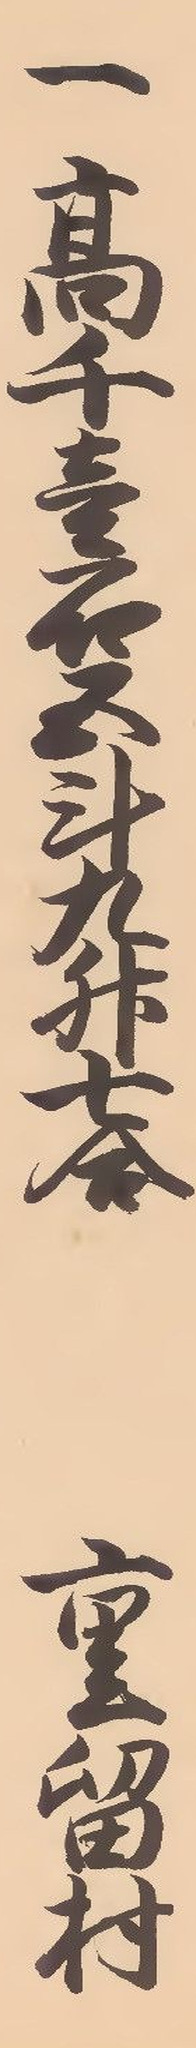一高千壱石五斗九升七合重留村
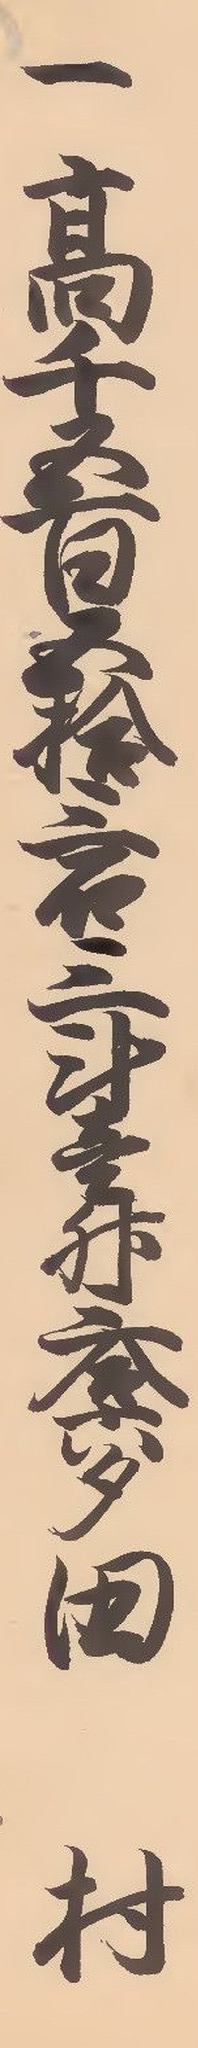一高千五百五拾三石三斗壱升三合六勺田村

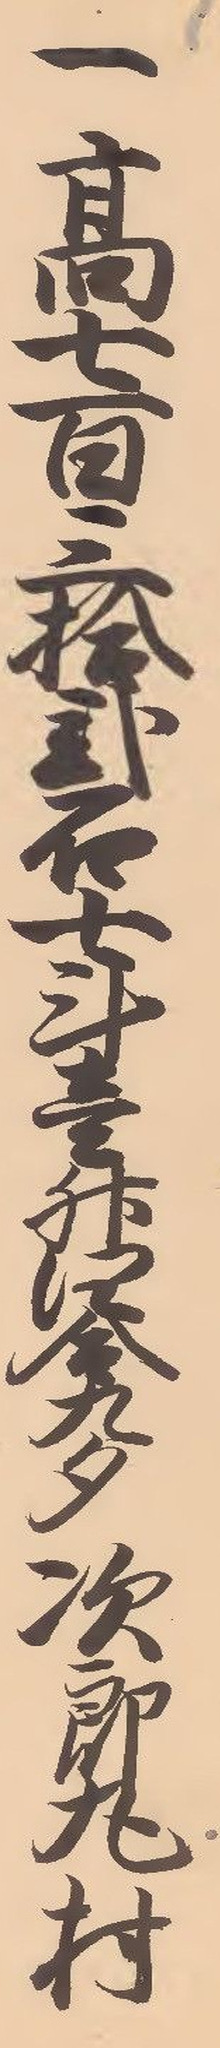一高七百三拾弐石七斗壱升四合九勺次郎丸村
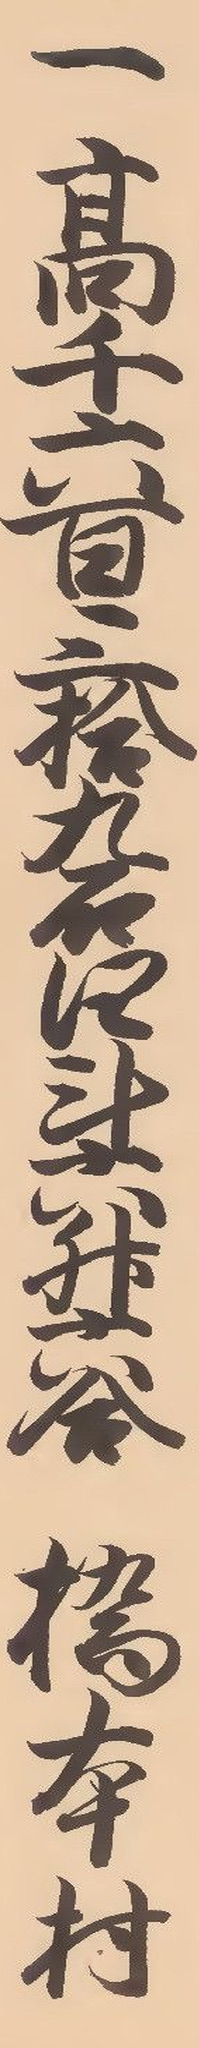一高千六百三拾九石四斗六升六合橋本村
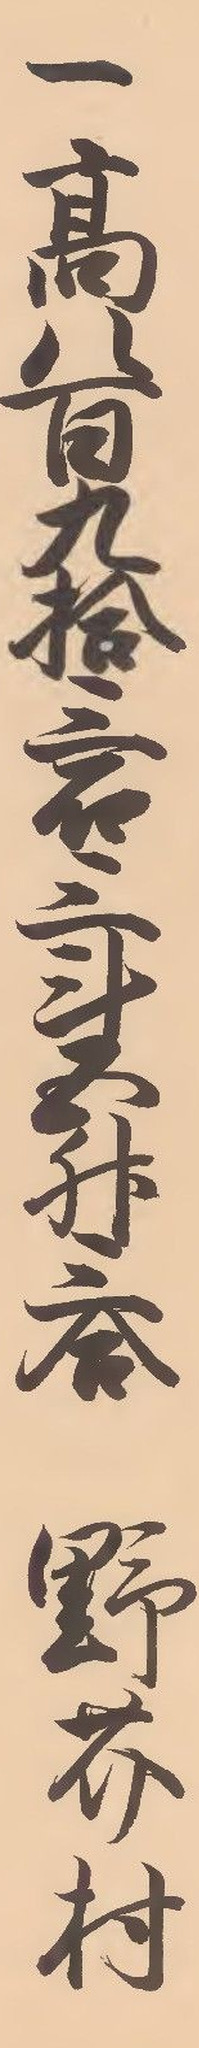一高八百九拾三石三斗五升三合野芥村
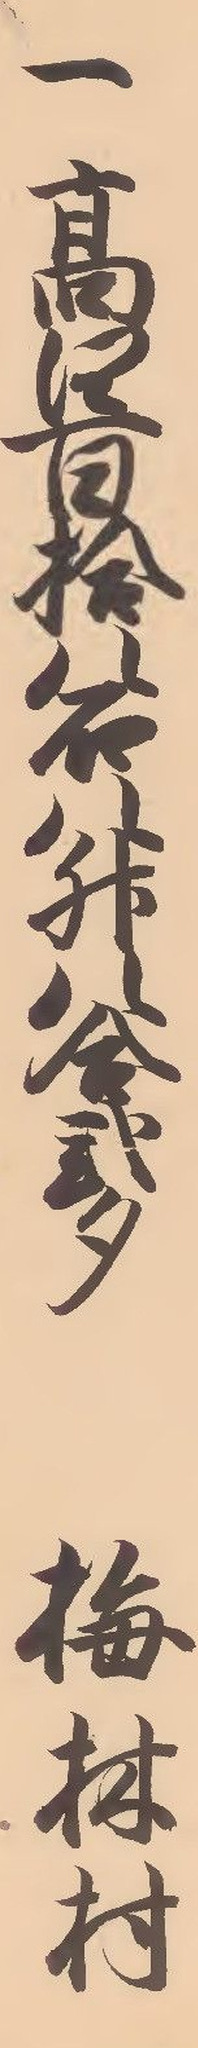一高四百拾八石八升八合弐勺梅林村

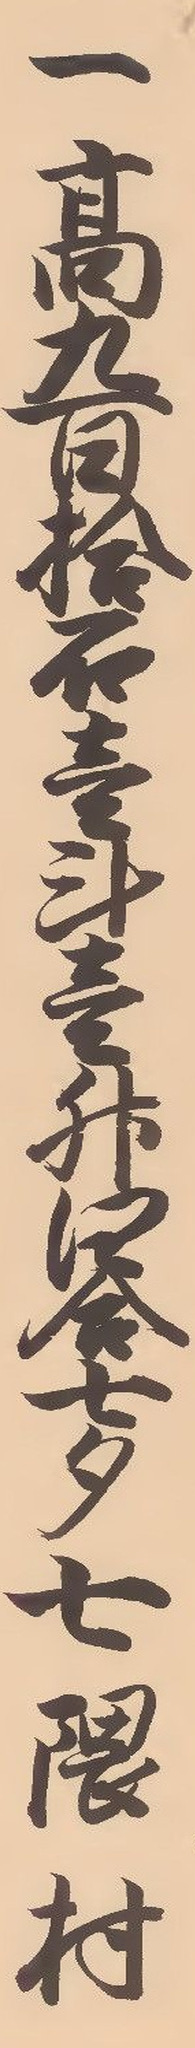一高九百拾石壱斗壱升四合七勺七隈村
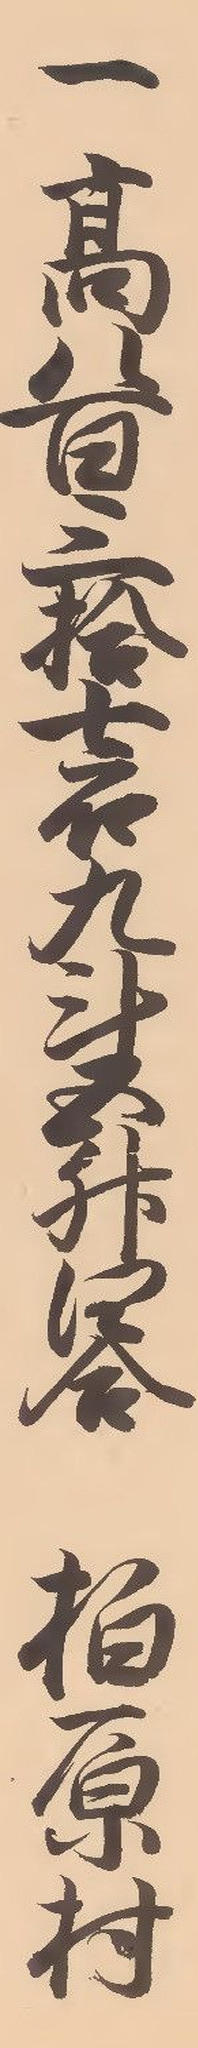一高八百三拾七石九斗五升四合柏原村
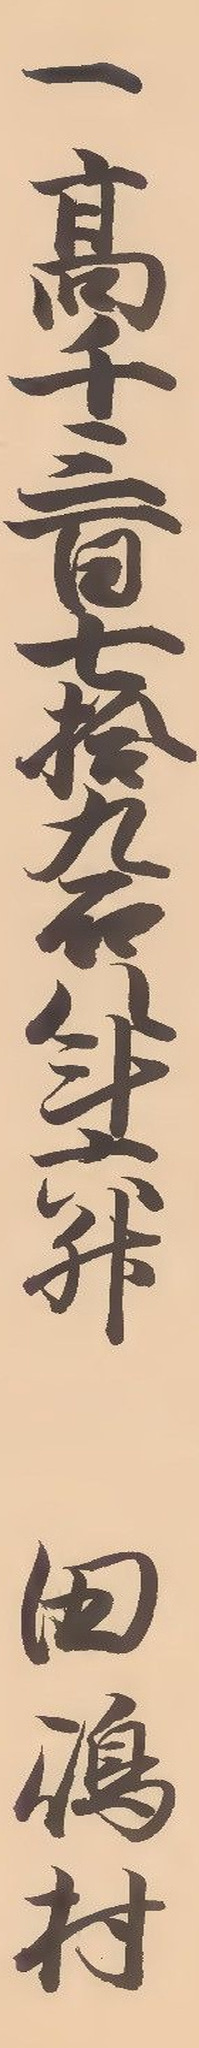一高千三百七拾九石八斗六升田島村
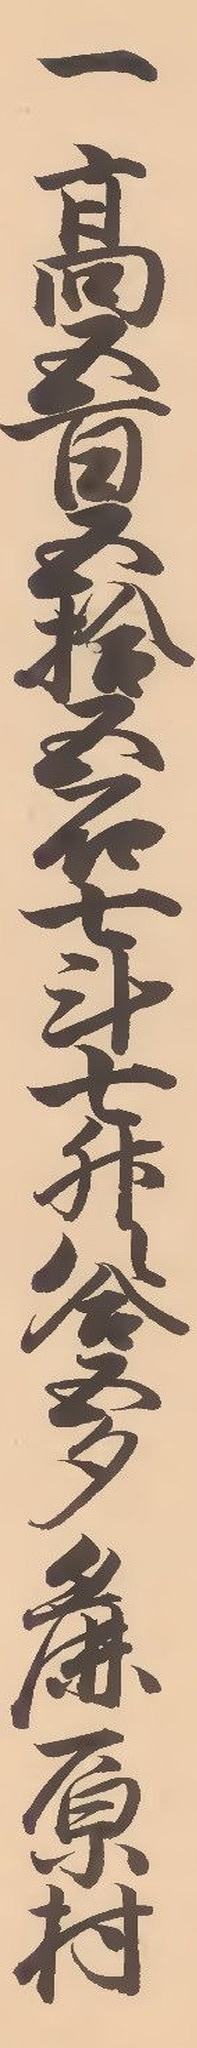一高五百五拾五石七斗七升八合五勺麁原村
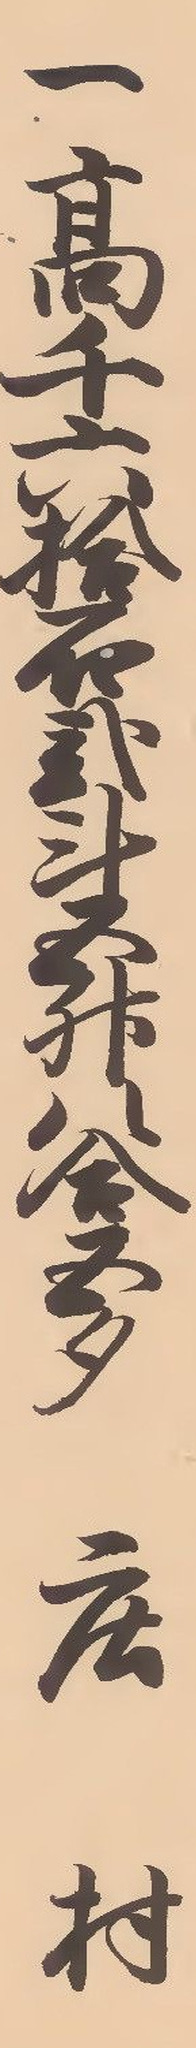一高千六拾石弐斗五升八合五勺庄村
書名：筑前国郷帳
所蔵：国立公文書館 National Archives of Japan
